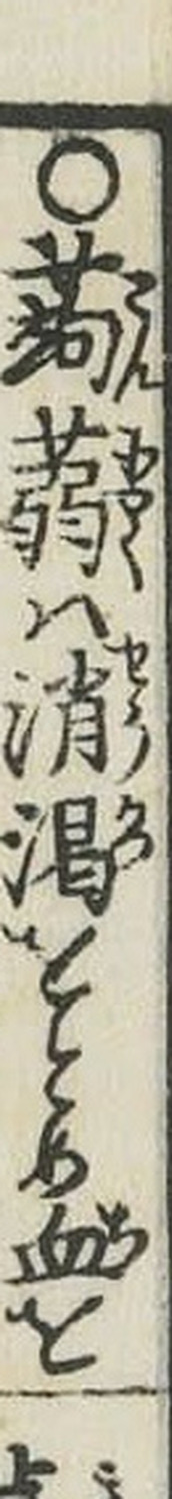○蒟蒻は消渇をとめ血を
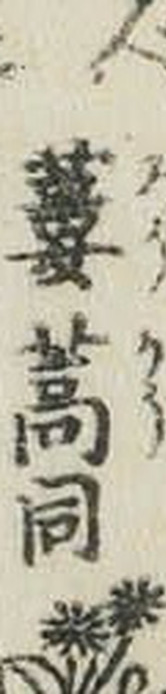薺蒿同
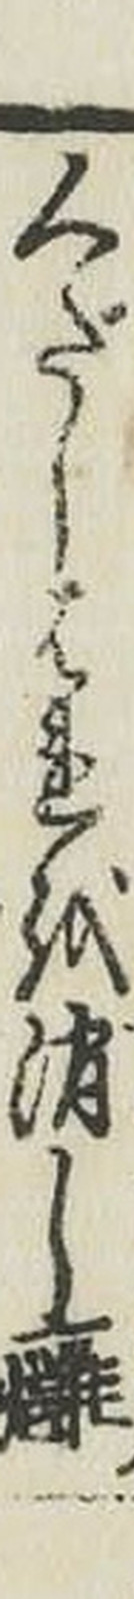くだしはれを消し癰
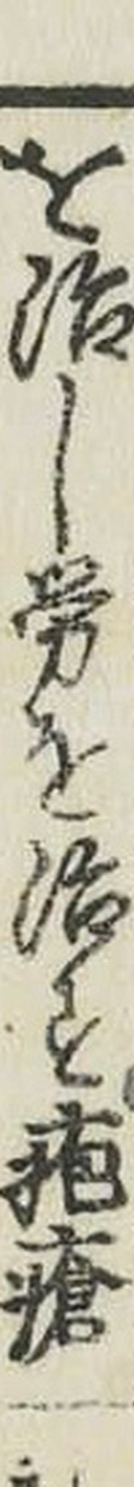を治し労を治す疱瘡
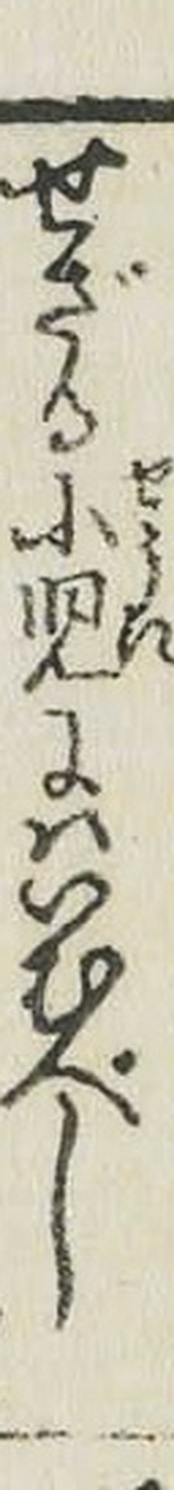せざる小児にはいむべし
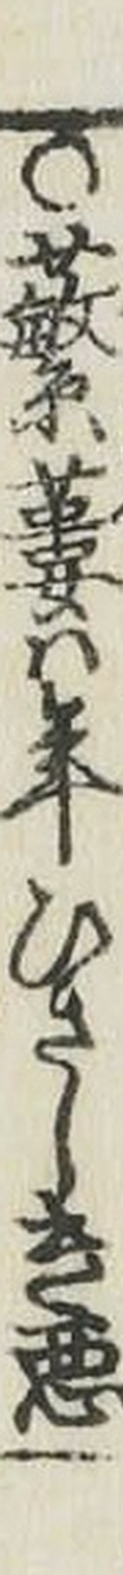○繁蔞は年のひさしき悪
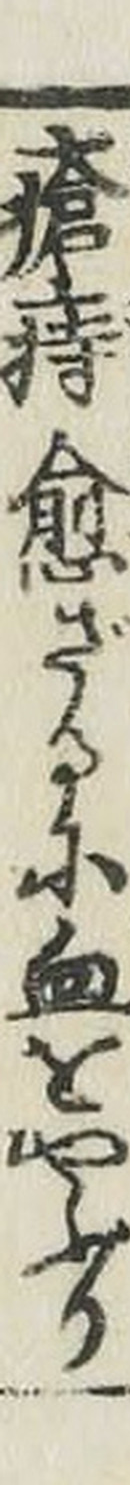瘡痔愈ざるに血をやぶり
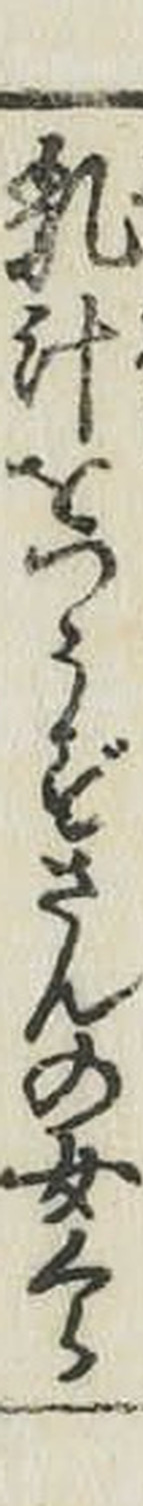乳汁をつうずさんの女くら
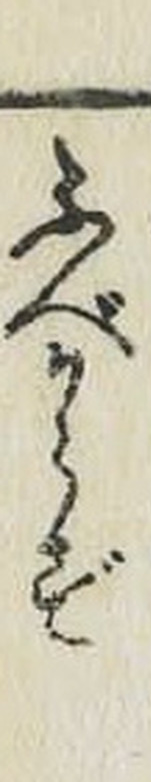ふべからず
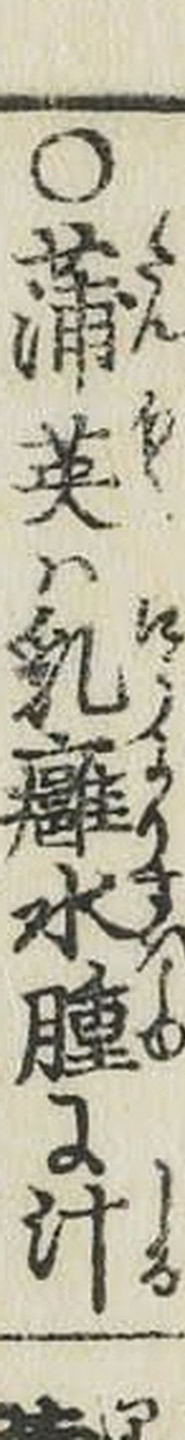○蒲英は乳癰水腫に汁
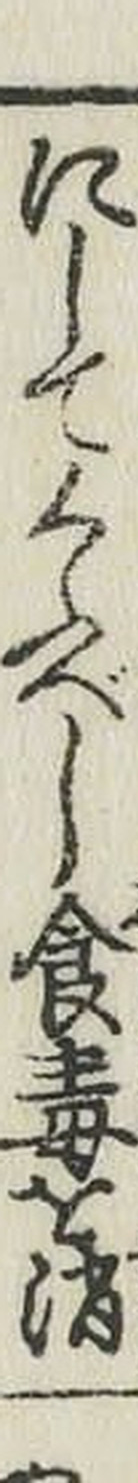にしてくふべし食毒を消
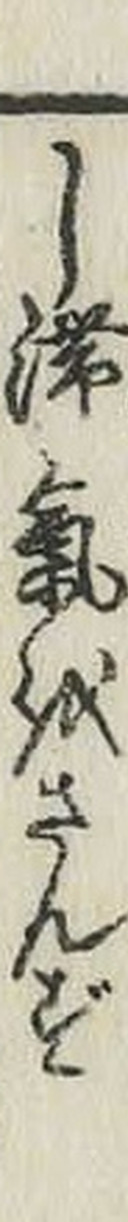し滞気をざんず
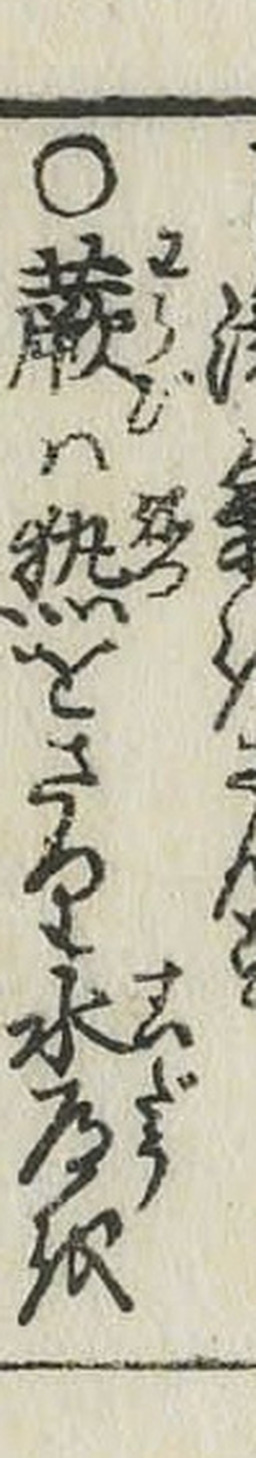○蕨は熱をさり水道を
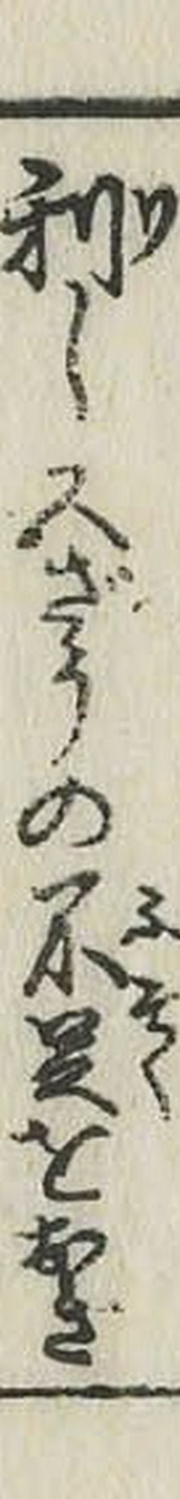利し五ざうの不足をおぎ
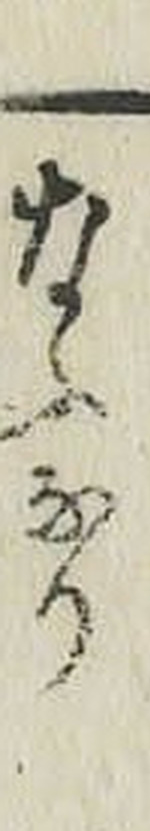なふなり
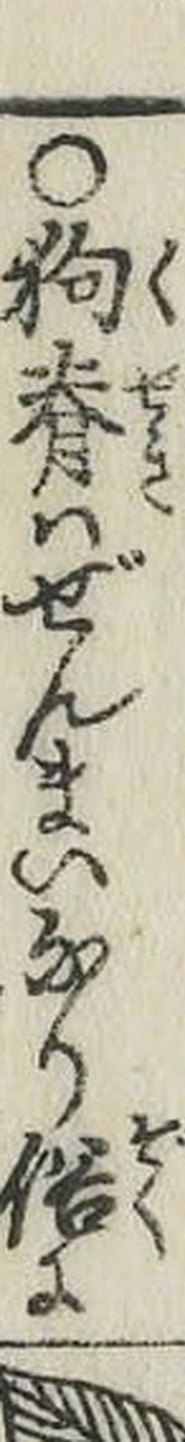○狗脊はぜんまいなり俗に
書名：増補頭書訓蒙図彙大成 10巻 8:巻之17-19
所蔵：東京学芸大学教育コンテンツアーカイブ
